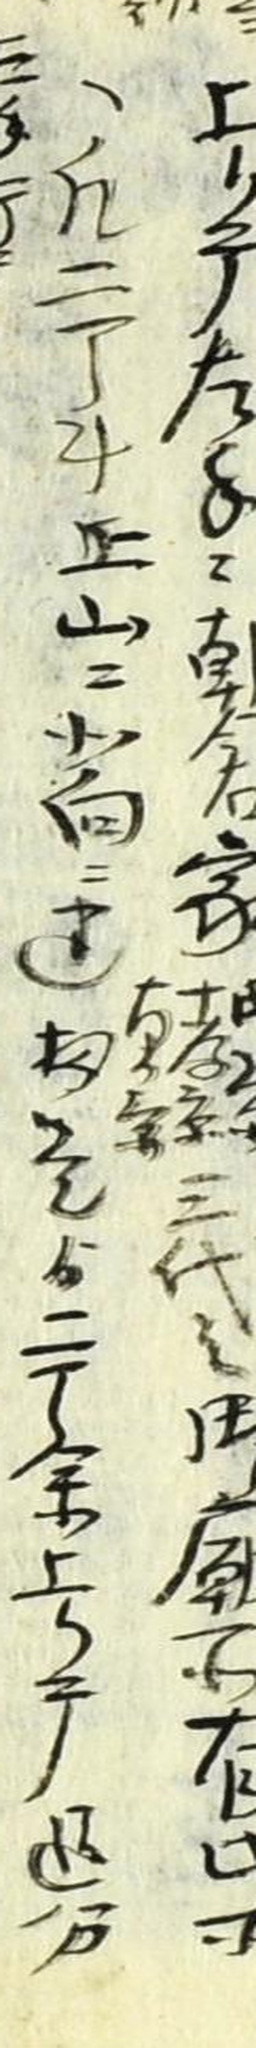へ凡二丁計上山に北向ニ建扨是ゟ二丁余上りテ追分
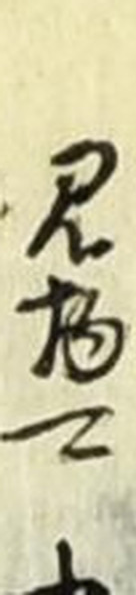見物可
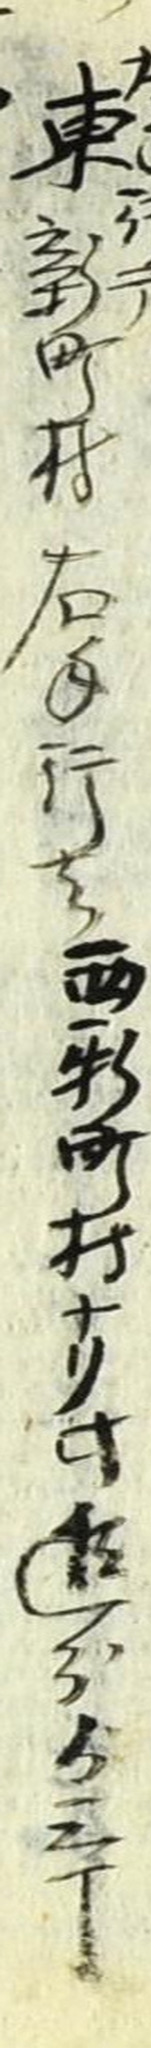東新町村右手行者西新町村ナリ此追分ゟ三丁
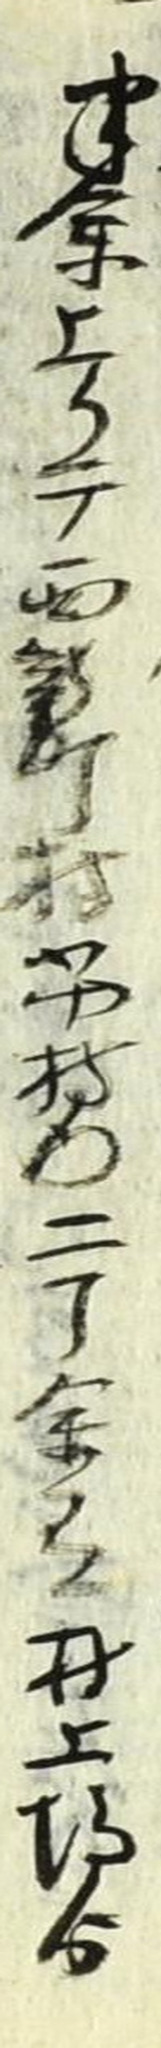半余上りテ西新町村当村内二丁余有村上場ゟ
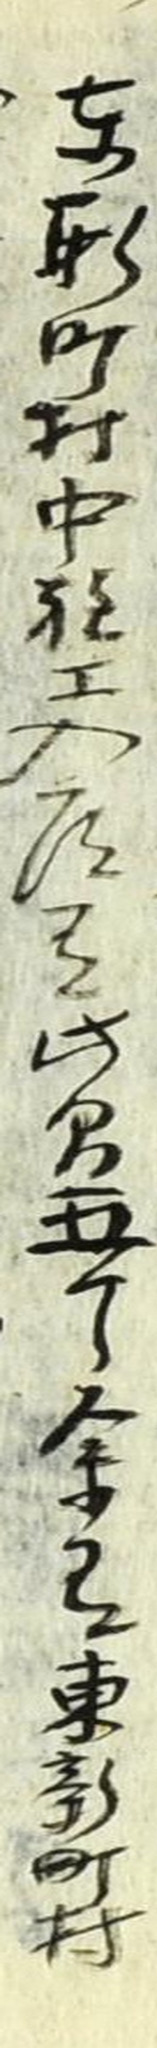東新町村中程エ入道有此間五丁余有東新町村
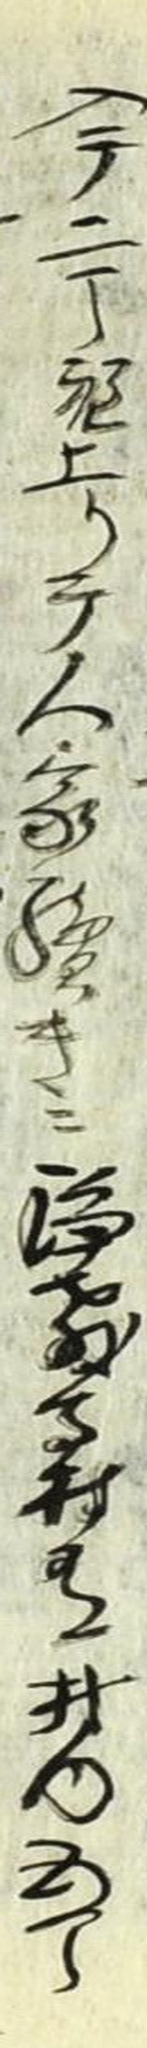入テ二丁程上りテ人家続きに浄教寺村有村内五丁
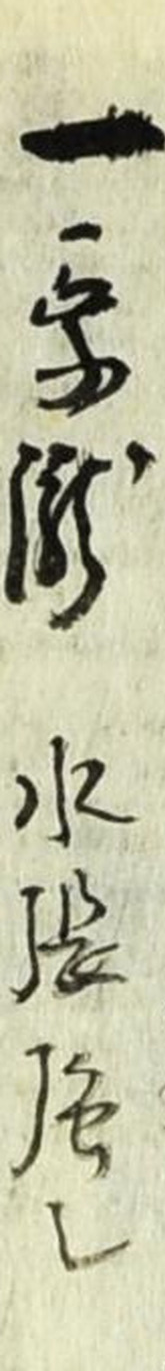一乗瀧水張強し
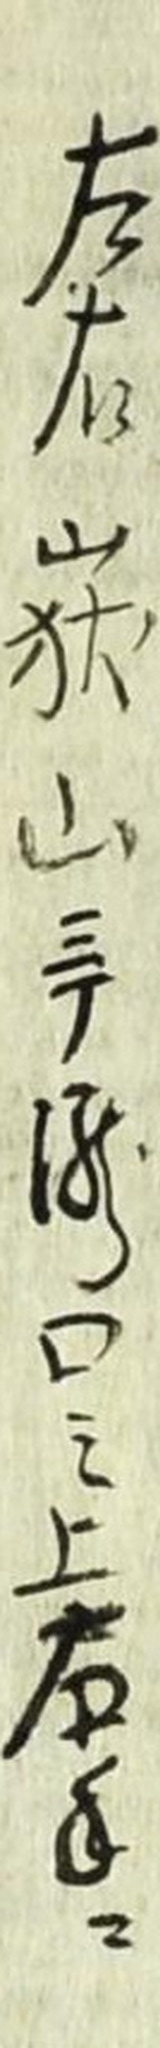左右嶽山ニテ瀧口之上右手ニ
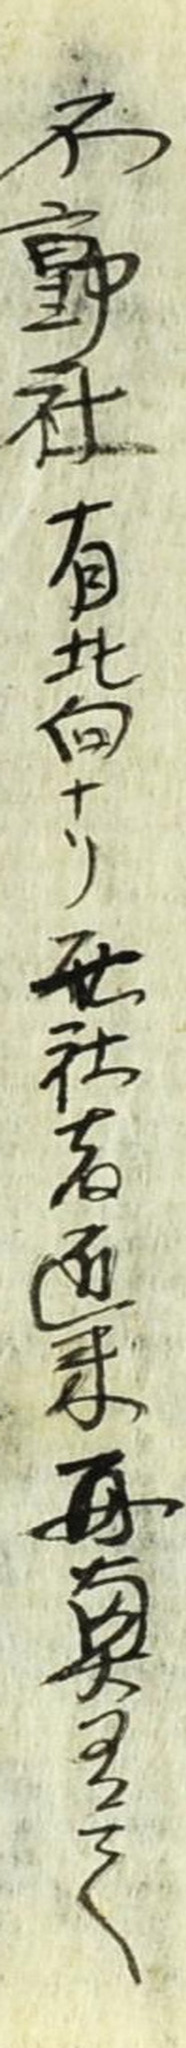不動社有北向ナリ此社者近来再興有之
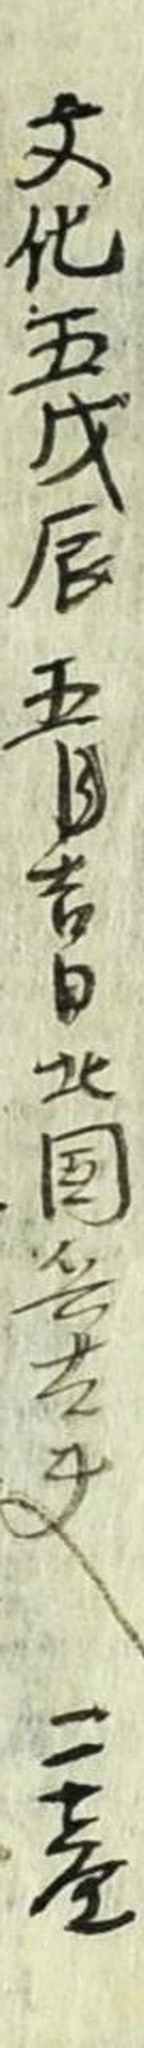文化五戊辰五月吉日北国兵太夫二基
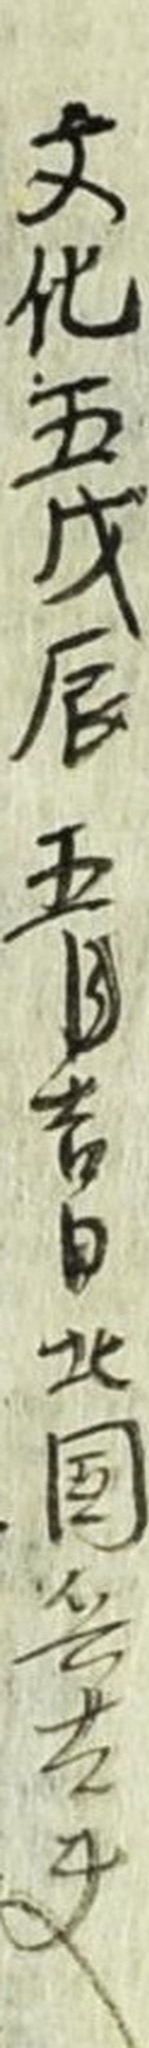文化五戊辰五月吉日北国兵太夫二基
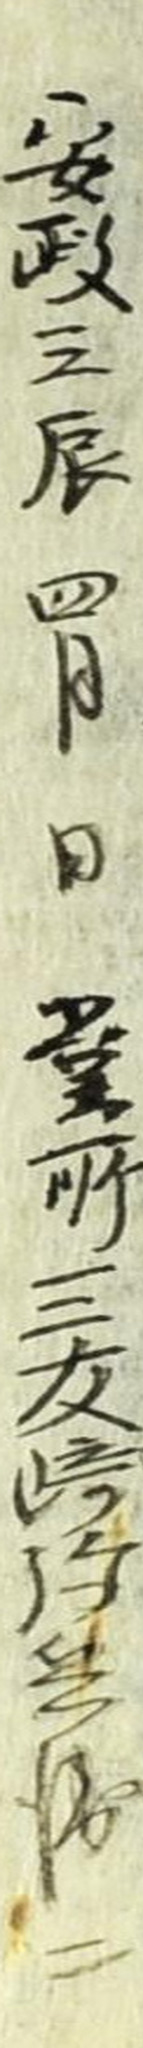安政三辰四月日堂所三友崎弥兵衛二
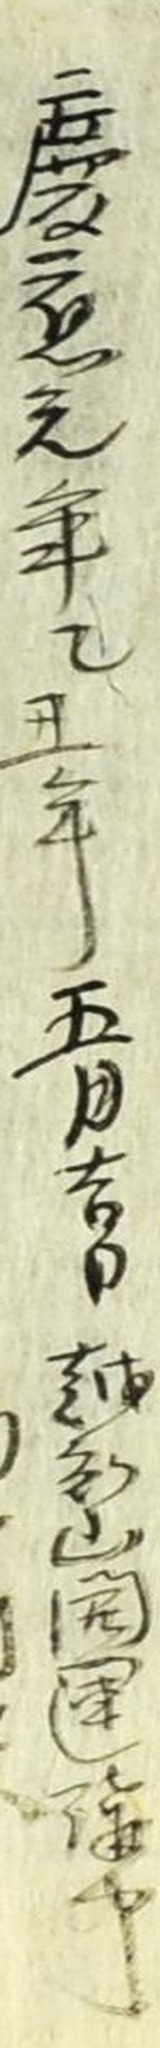慶応元年乙丑年五月吉日越知山開運講中
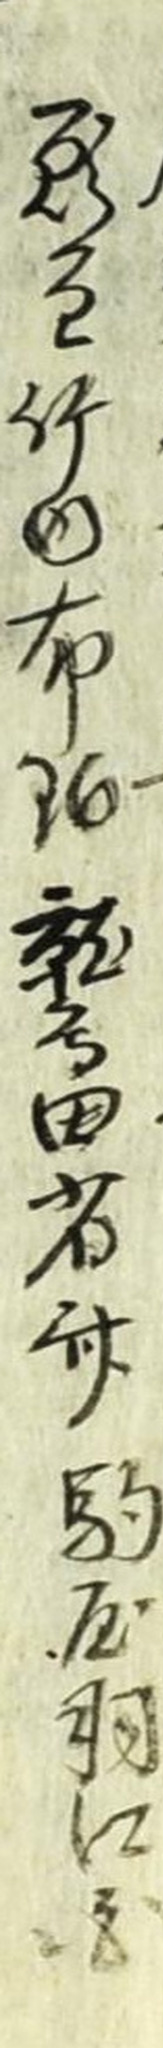願主竹内布珀鷲田省斎駒屋羽江国
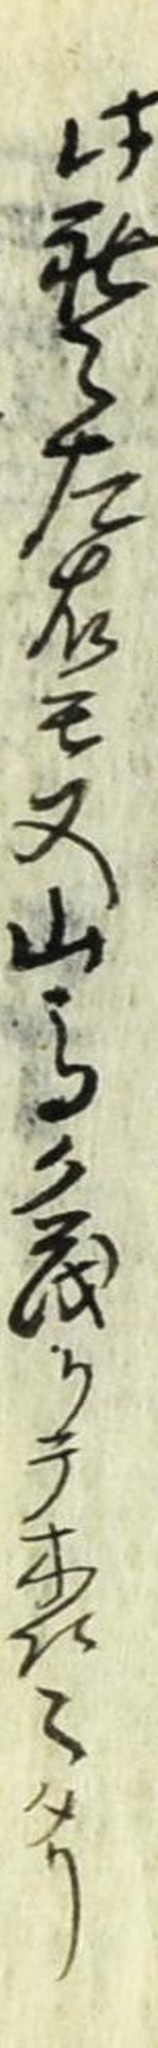此社之左右モ又山高ク茂りて森々タリ
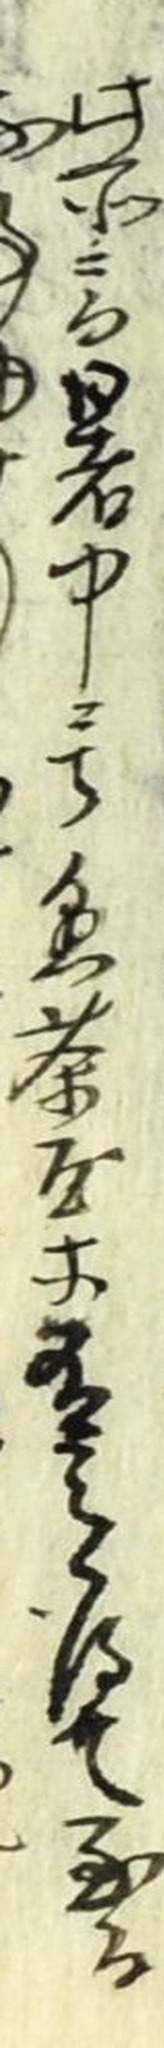此所二而暑中ニ者懸茶屋等有之候得共至而
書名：（日記）
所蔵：福井県文書館 Fukui Prefectural Archives
